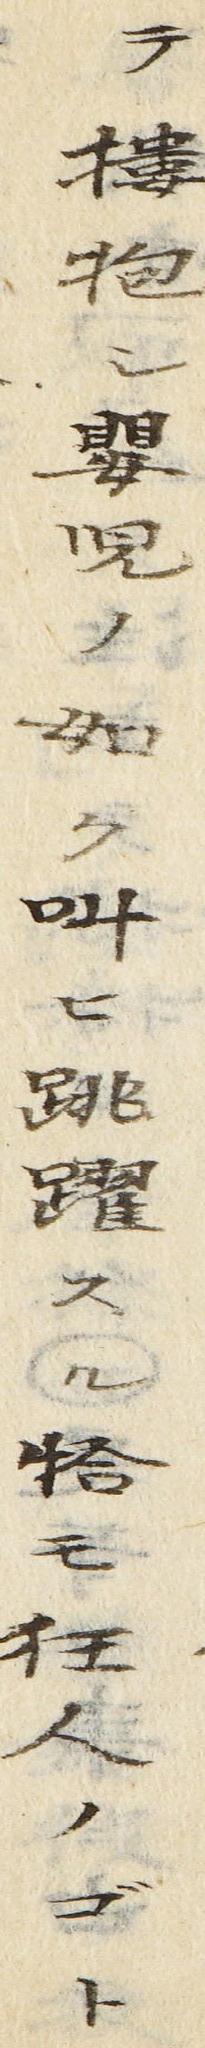テ摟抱シ嬰児ノ如ク叫ヒ跳躍スル恰モ狂人ノゴト
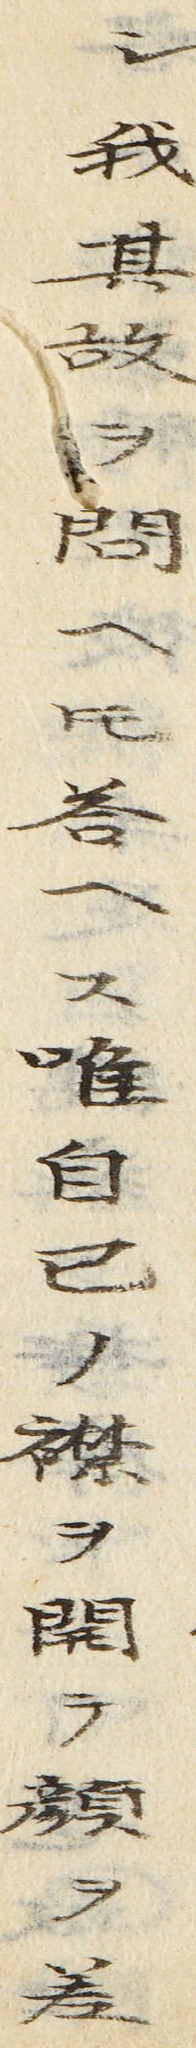シ我其故ヲ問ヘトモ答ヘス唯自己ノ襟ヲ開テ顔ヲ差

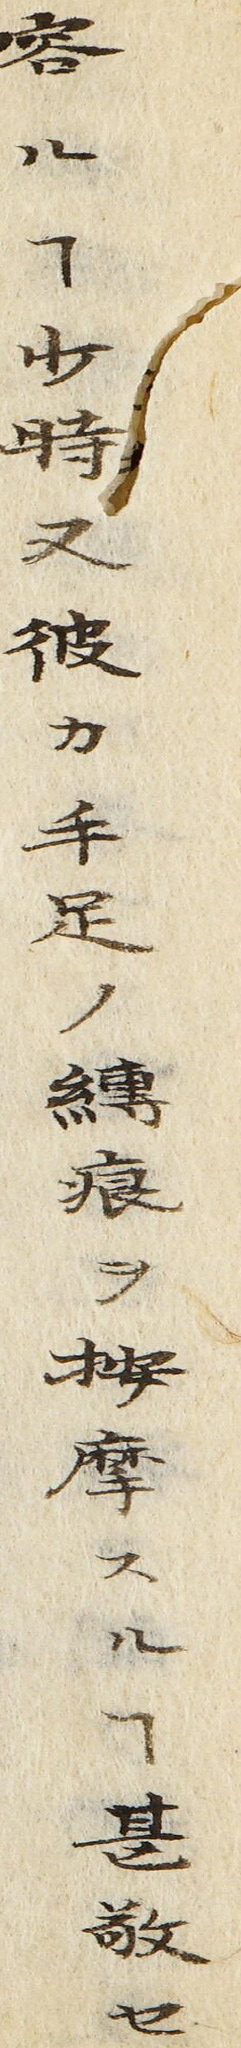容ルコト少時又彼カ手足ノ縛痕ヲ按摩スルコト甚敬セ
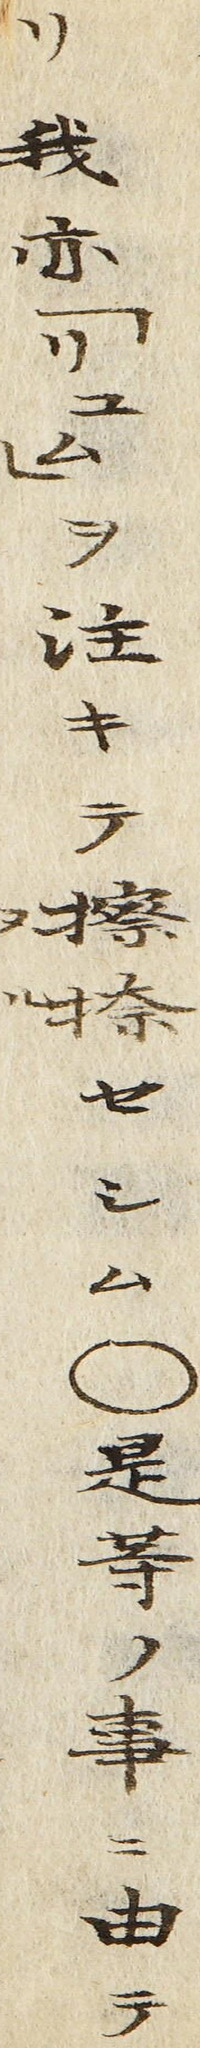リ我亦「リュム」ヲ注キテ擦捺セシム◯是等ノ事ニ由テ
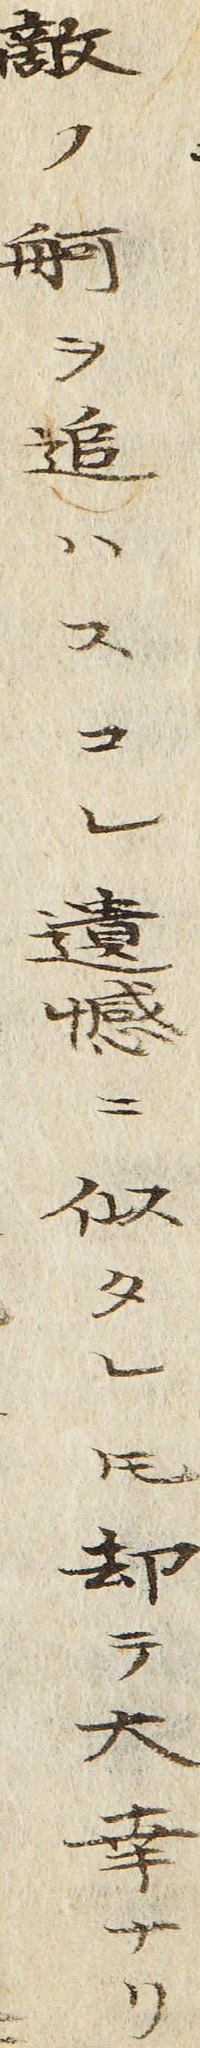敵ノ舸ヲ追ハスコレ遺憾ニ似タレトモ却テ大幸ナリ
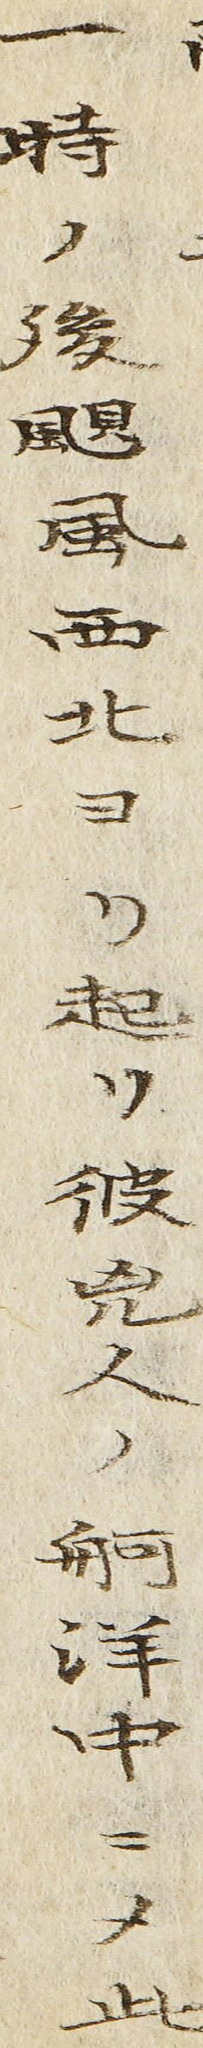一時の後颶風西北ヨリ起リ彼兇人ノ舸洋中ニシテ此
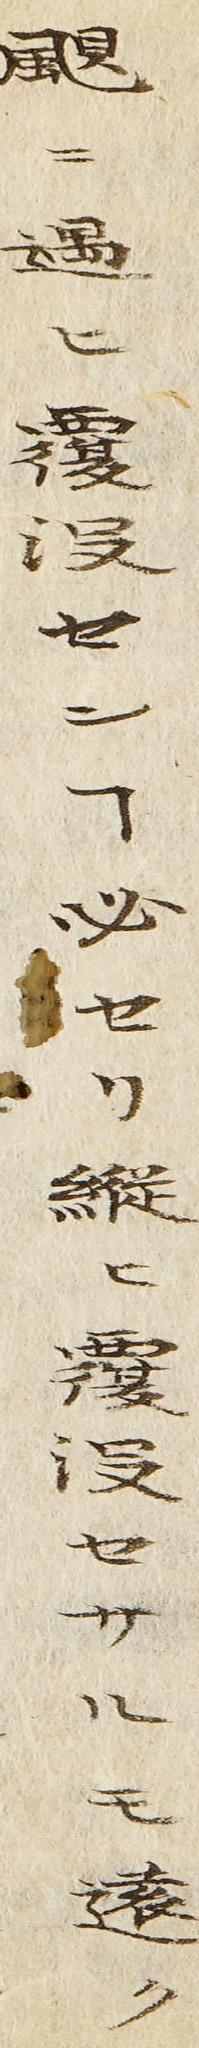颶ニ遇ヒ覆没センコト必セリ縦ヒ覆没セサルモ遠ク
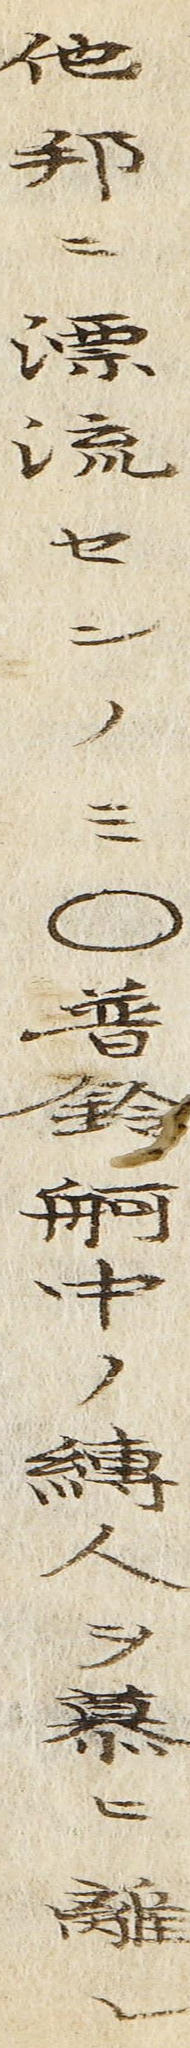他邦ニ漂流センノミ◯普鈴舸中ノ縛人ヲ慕ヒ離レ
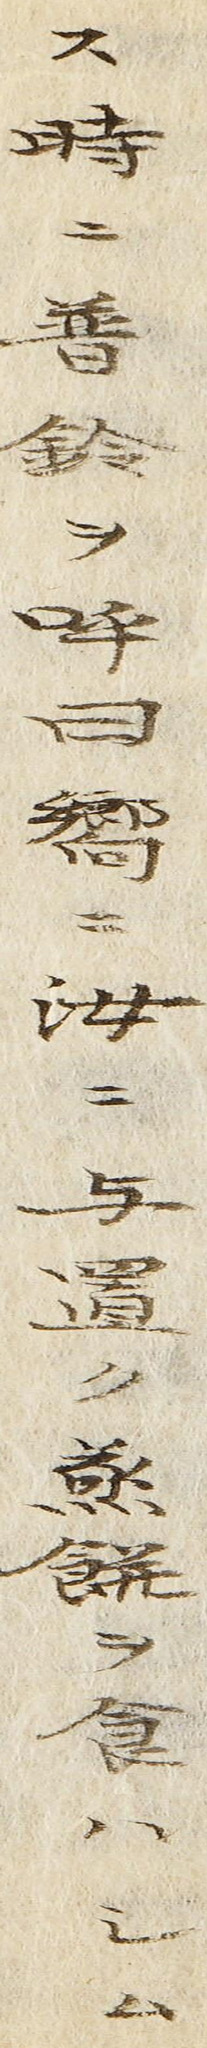ス時ニ普鈴ヲ呼曰嚮ニ汝ニ与置ク蒸餅ヲ食ハシム
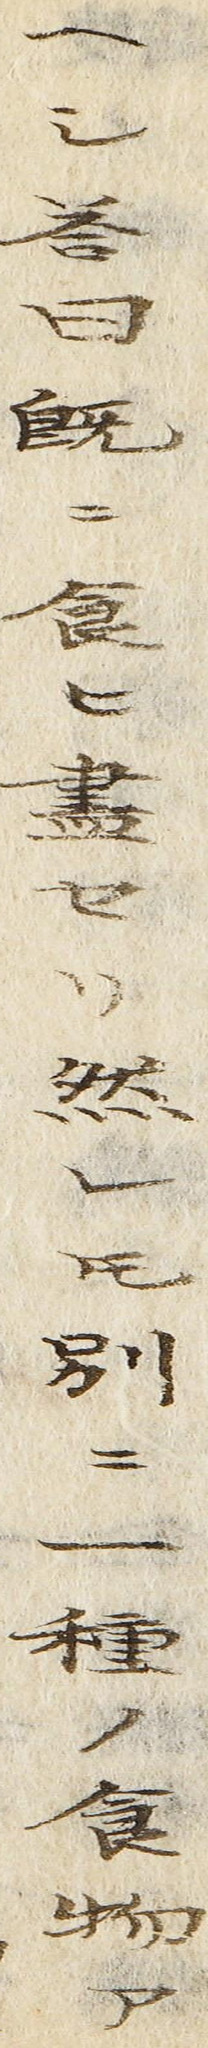ヘシ答曰既ニ食ヒ尽セリ然レトモ別ニ一種ノ食物ア
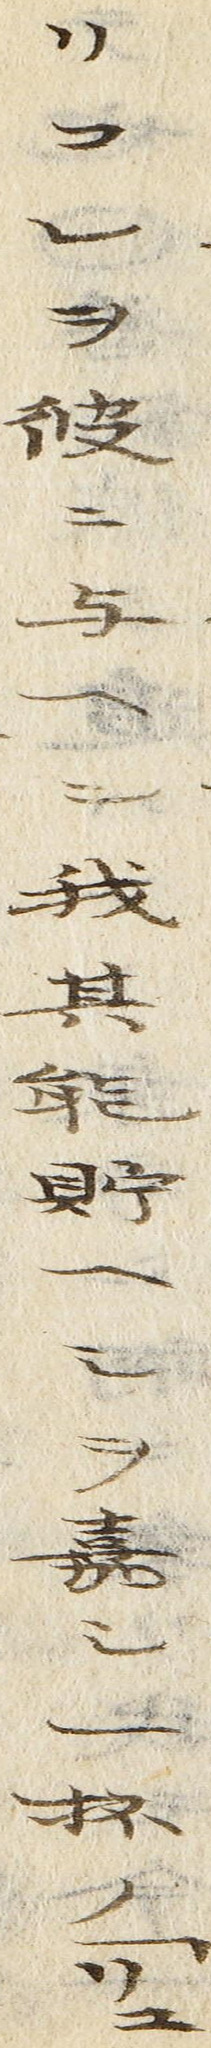リコレヲ彼ニ与ヘン我其能貯ヘシヲ嘉シ一杯ノ「リュ
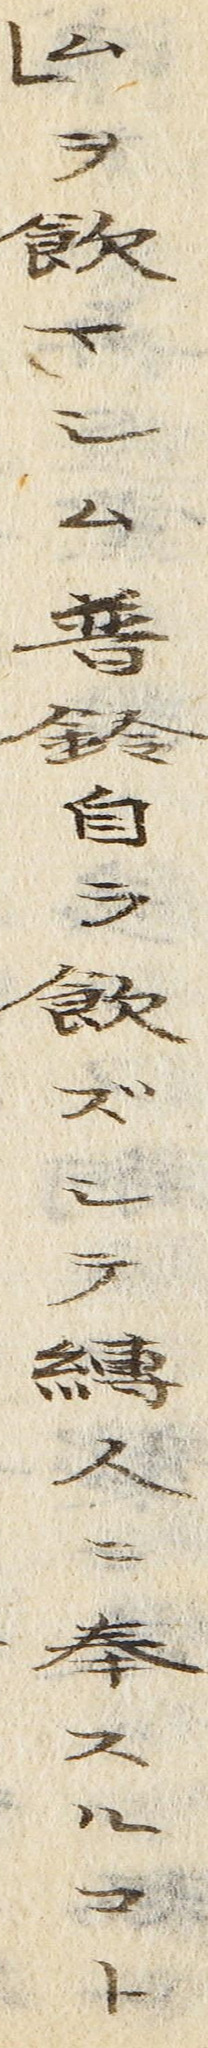ム」ヲ飲マシム普鈴自ラ飲ズシテ縛人ニ奉スルコト
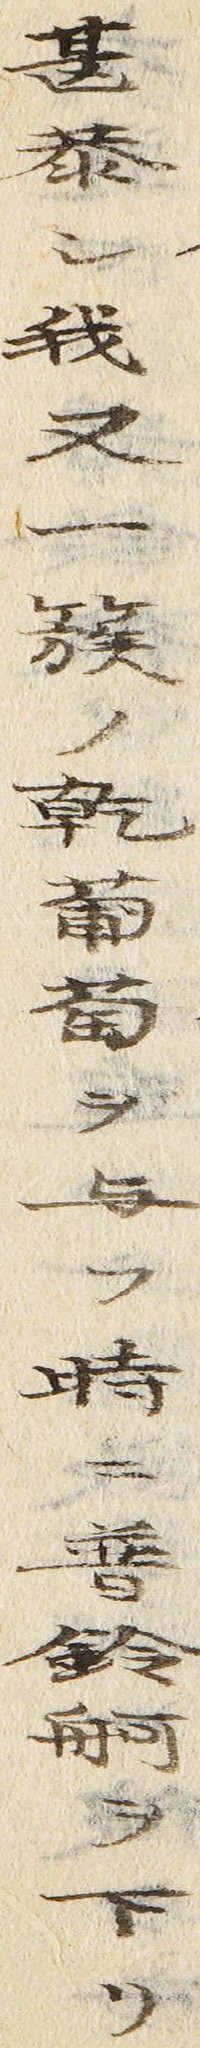甚恭シ我又一簇ノ乾葡萄ヲ与フ時ニ普鈴舸ヲ下リ
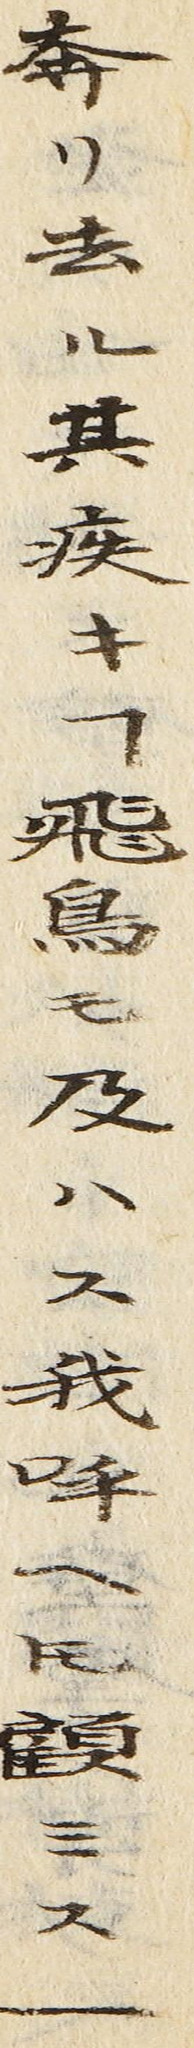奔リ去ル其疾キコト飛鳥モ及ハス我呼ヘトモ顧ミス一
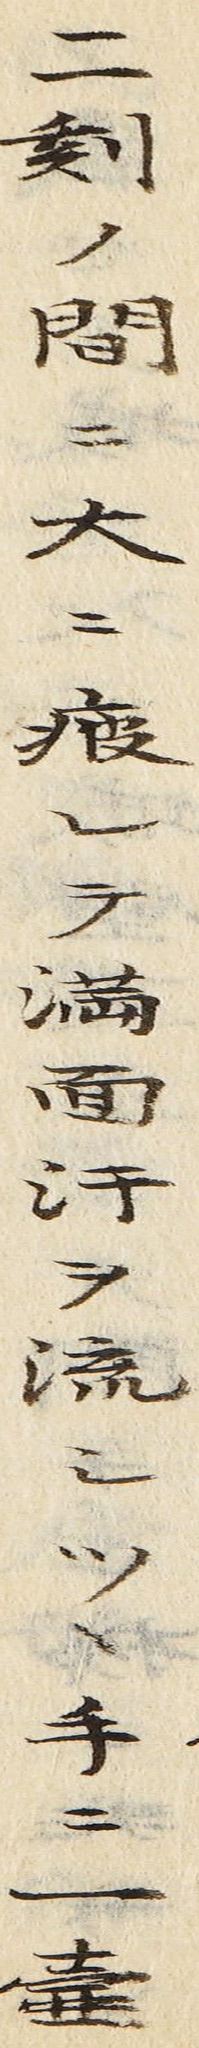二刻ノ間ニ大ニ疲レテ満面汗ヲ流シツヽ手ニ一壺
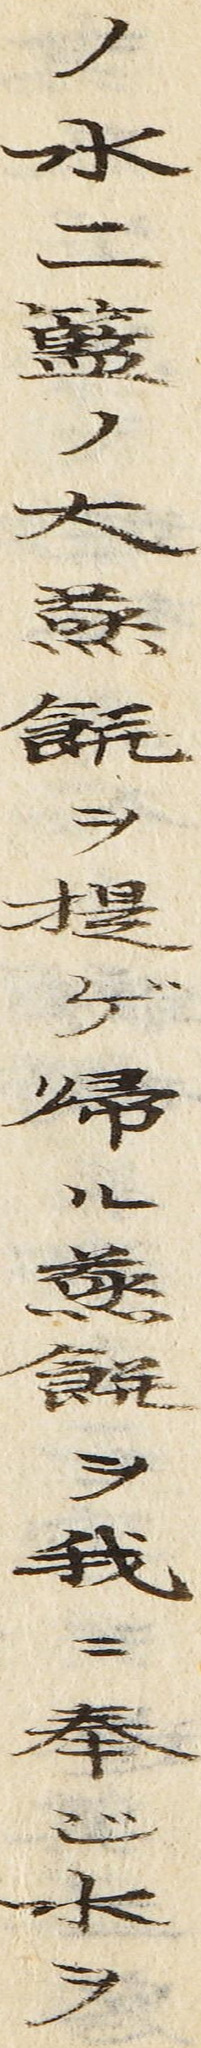ノ水二籃ノ大蒸餅ヲ提ゲ帰ル蒸餅ヲ我ニ奉ジ水ヲ
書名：漂流紀事
